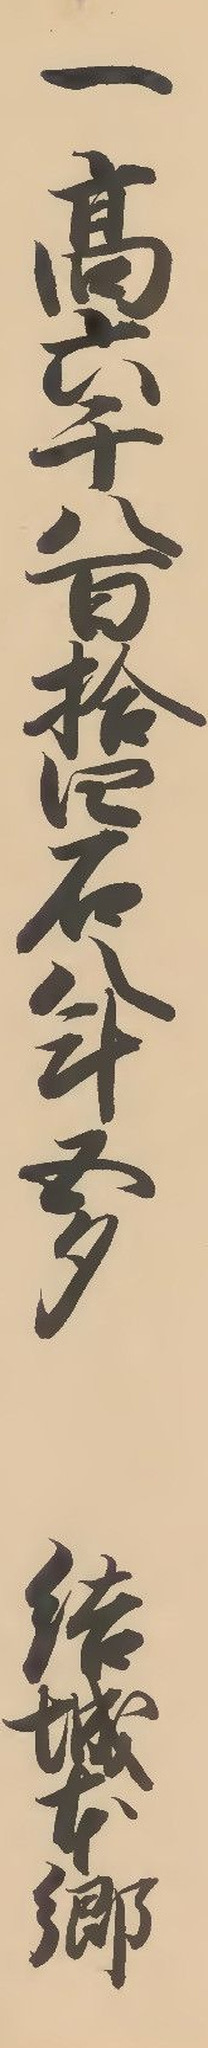一高六千八百拾四石八斗五勺結城本郷
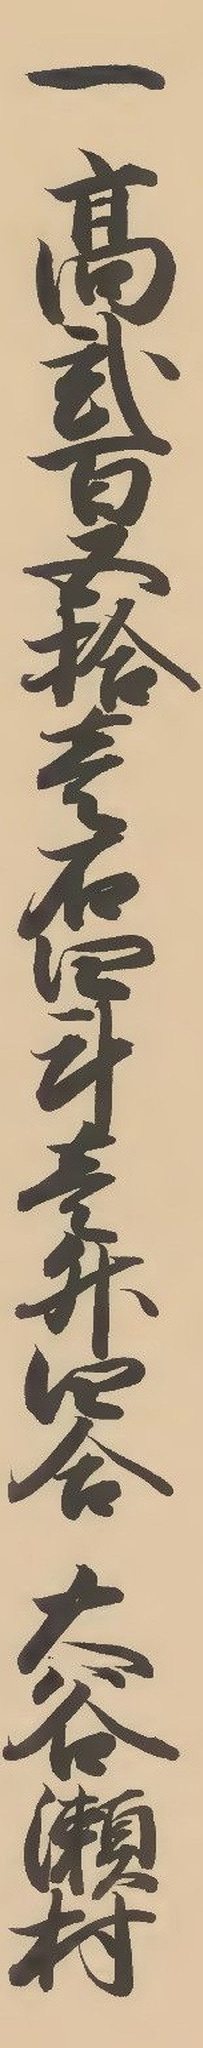一高弐百五拾壱石四斗壱升四合大谷瀬村
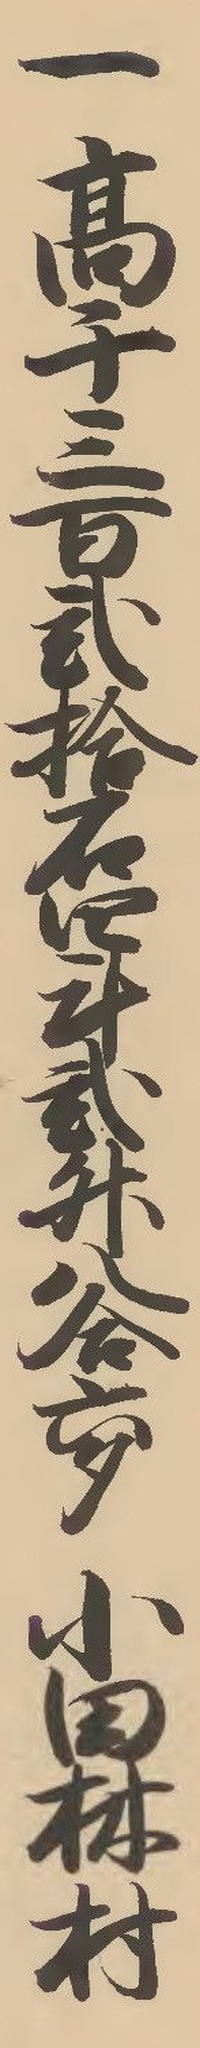一高千三百弐拾石四斗弐升八合六勺小田林村

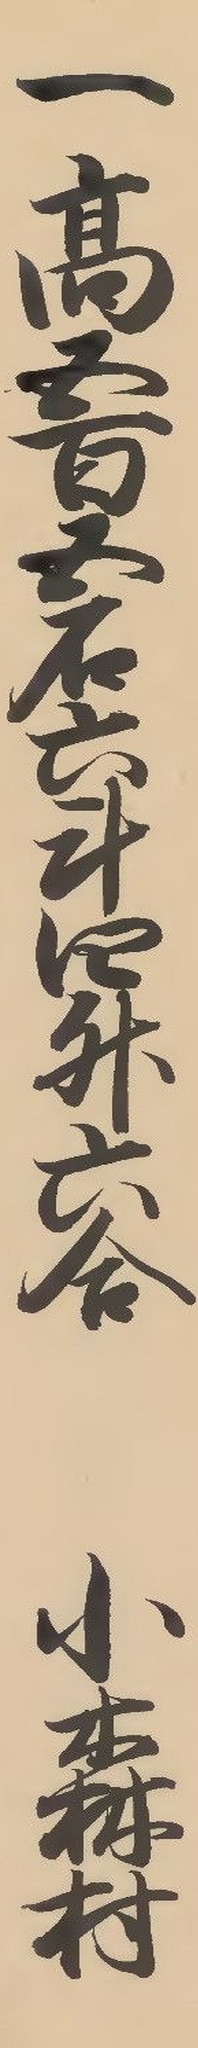一高五百五石六斗四升六合小森村
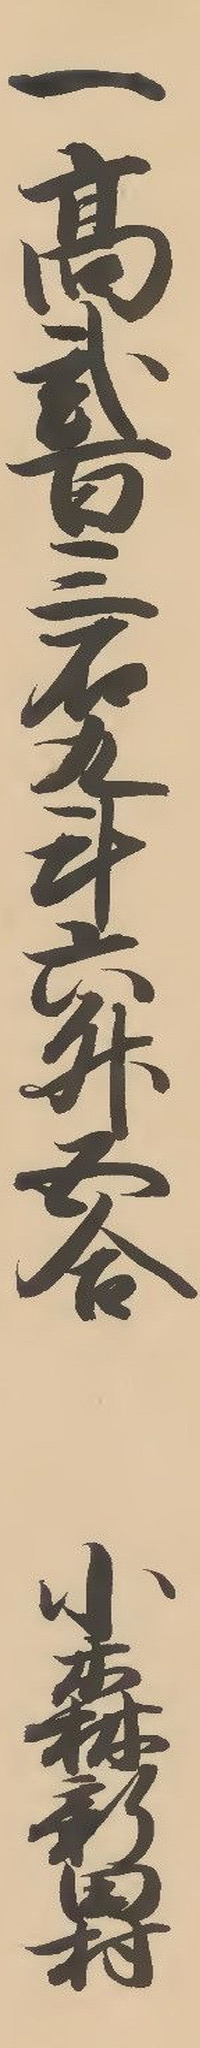一高弐百三石九斗六升五合小森新田村
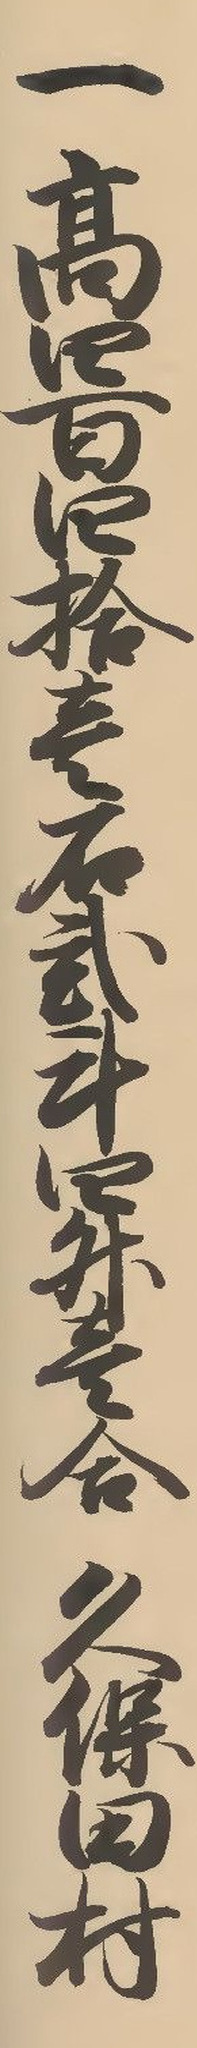一高四百四拾壱石弐斗四升壱合久保田村
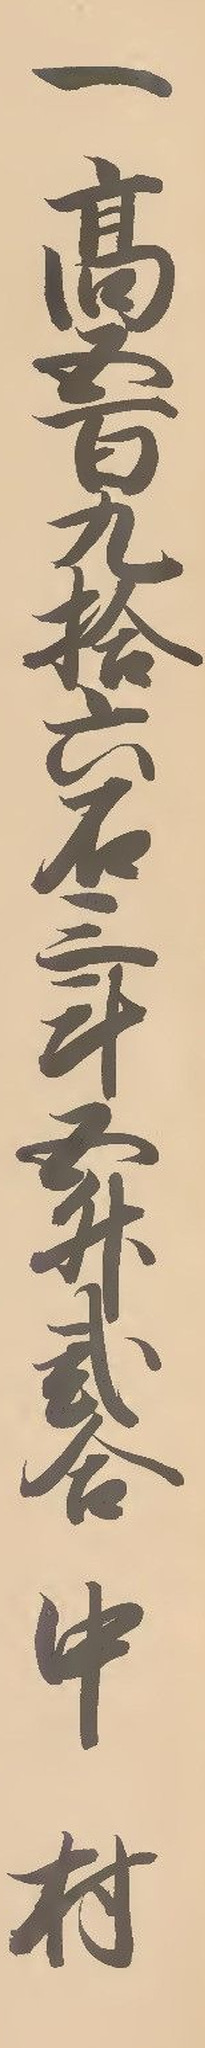一高五百九拾六石三斗五升弐合中村
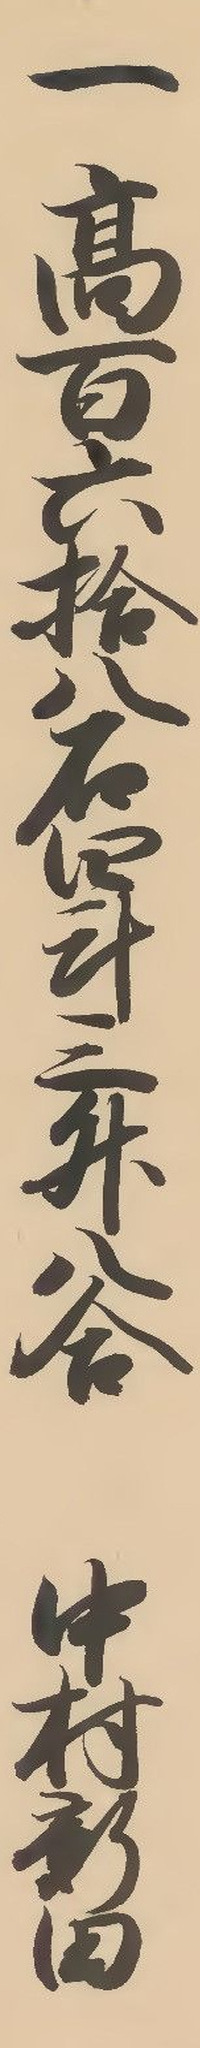一高百六拾八石四斗三升八合中村新田
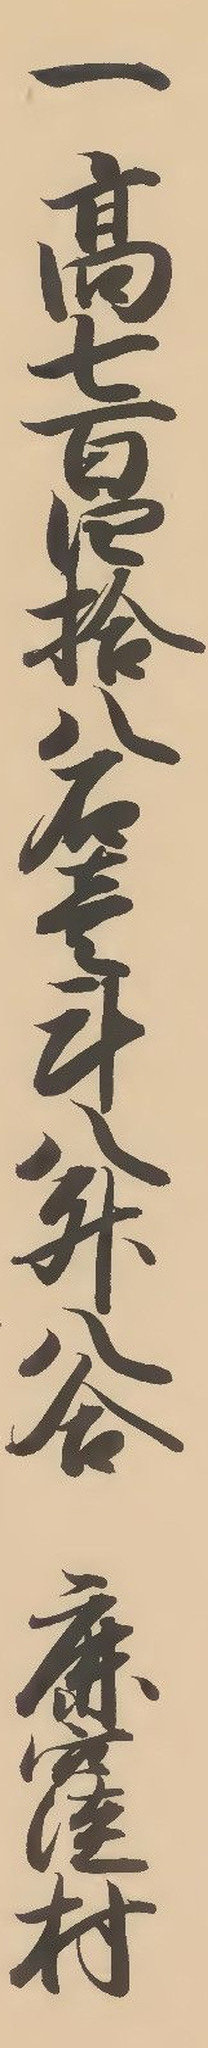一高七百四拾八石壱斗八升八合鹿窪村
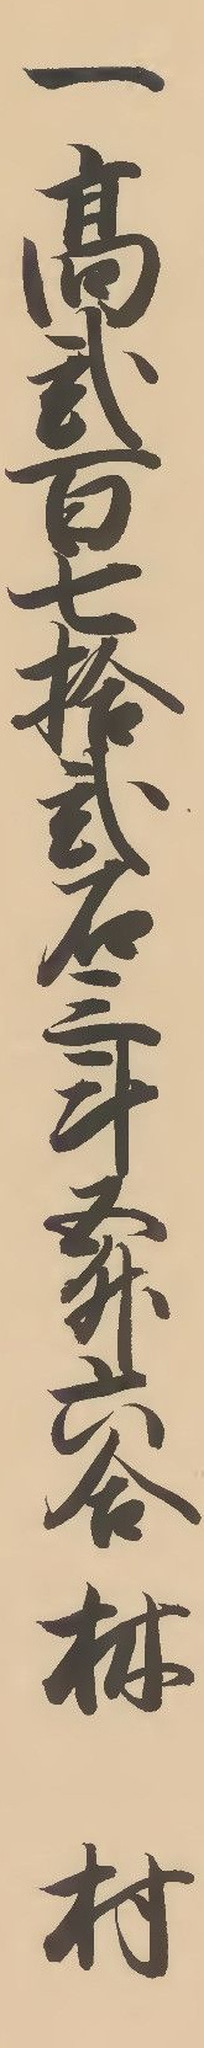一高弐百七拾弐石三斗五升六合林村

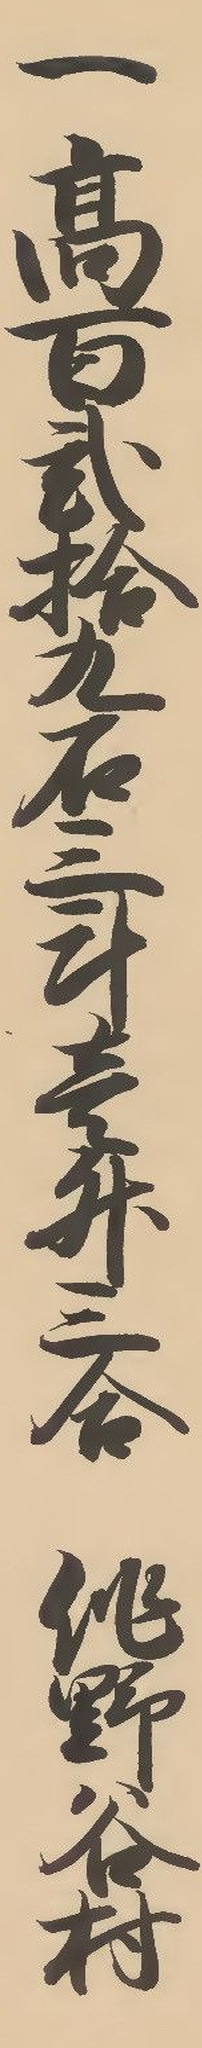一高百弐拾九石三斗壱升三合作野谷村
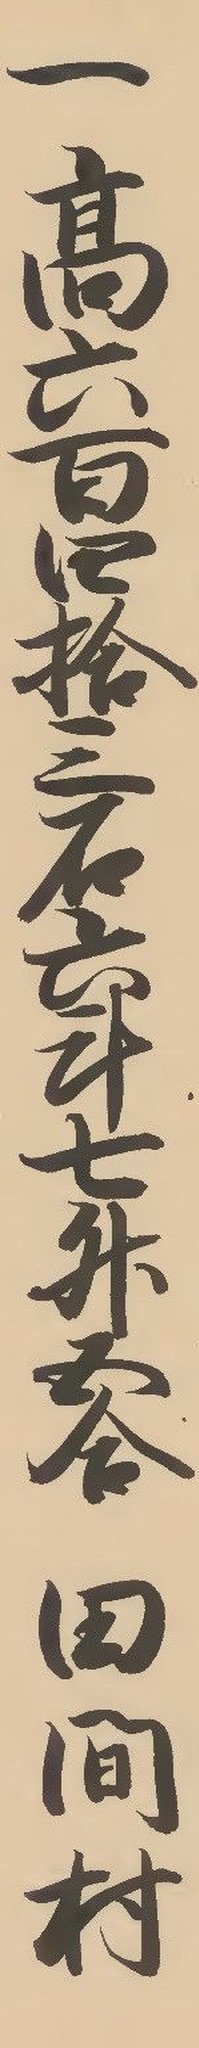一高六百四拾三石六斗七升五合田間村
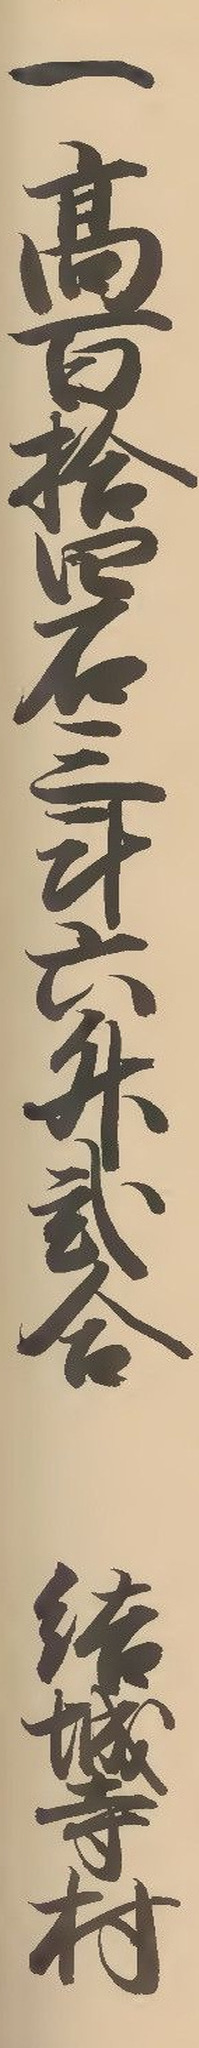一高百拾四石三斗六升弐合結城寺村
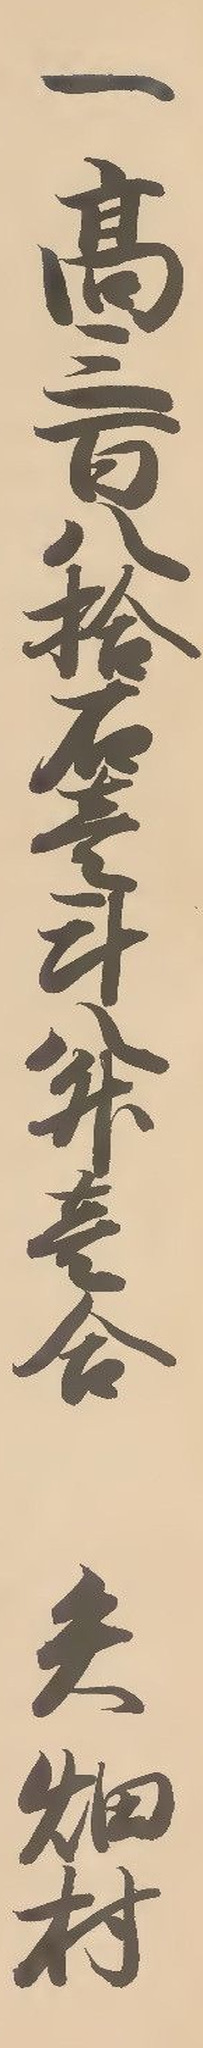一高三百八拾石壱斗八升壱合矢畑村
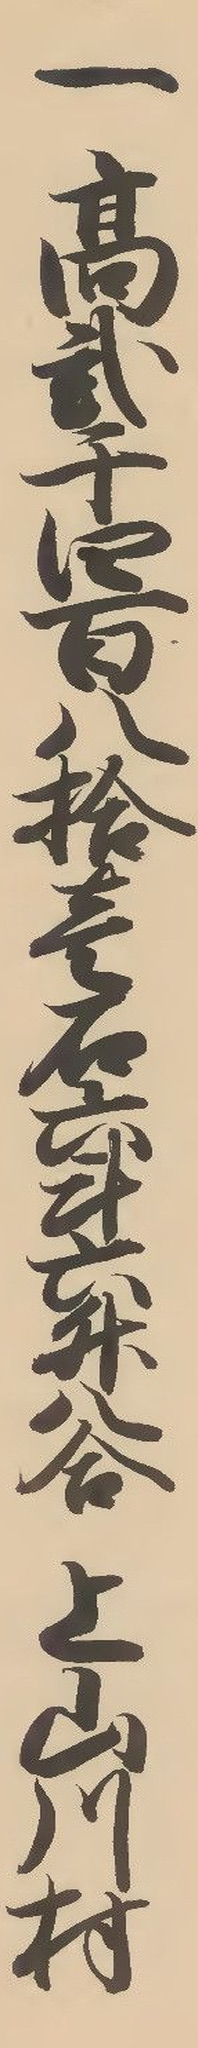一高弐千四百八拾壱石六斗六升八合上山川村
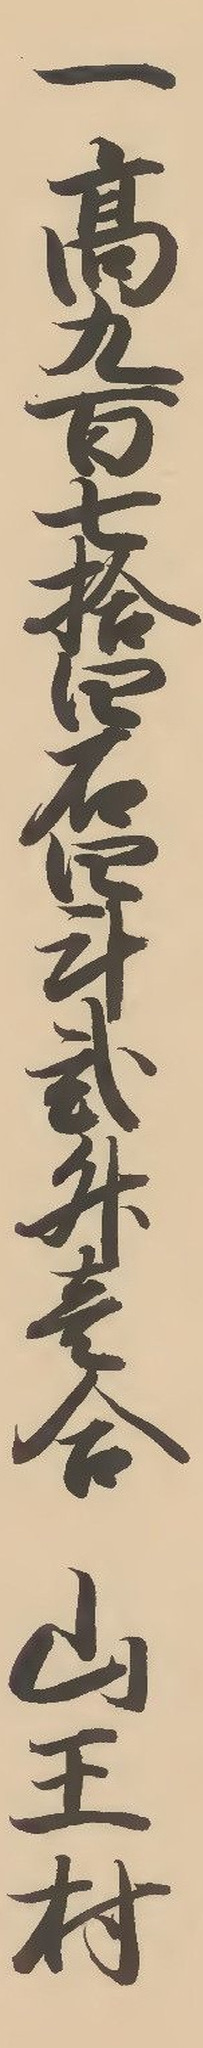一高九百七拾四石四斗弐升壱合山王村
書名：下総国郷帳
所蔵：国立公文書館 National Archives of Japan
